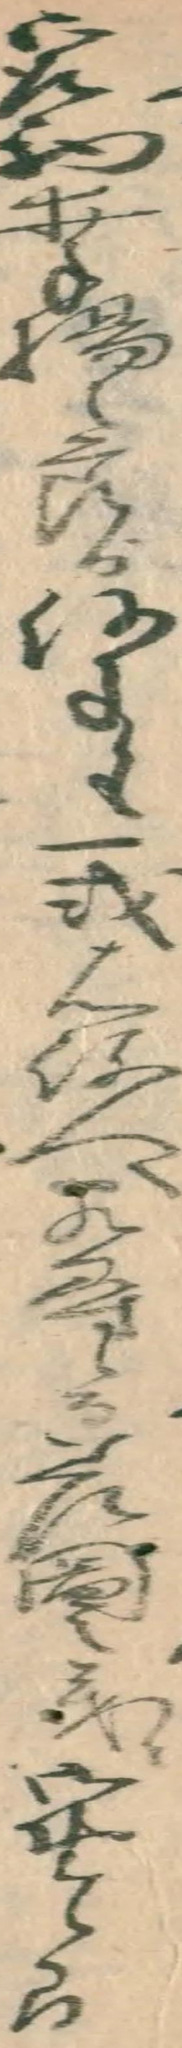最初井手揚候節ゟ何事も一式右役人へ相尋候而差図之義ニ御座候間
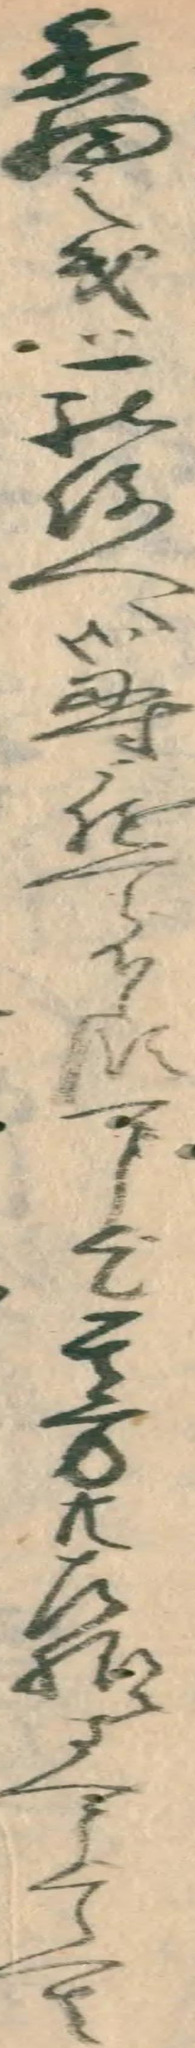委細之義ハ一社役人へ御尋被遊可被下候段可申上候其方共左様ニさへ申上候へ者
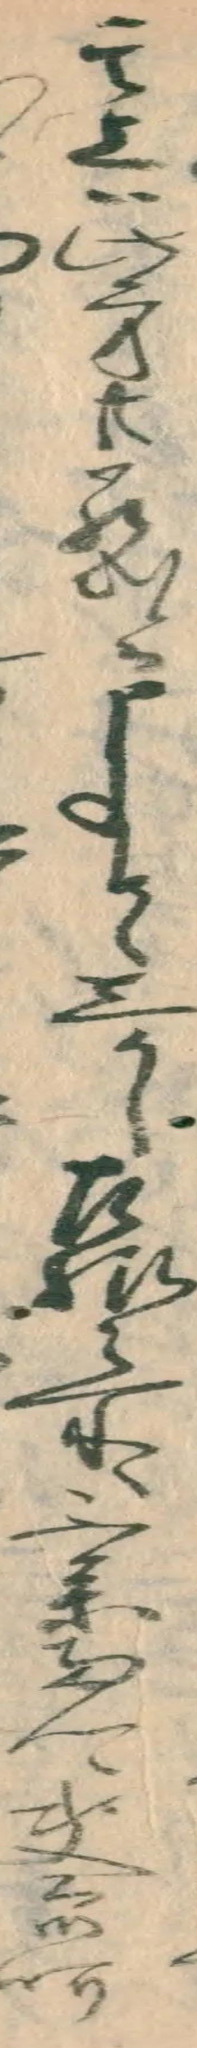其上ハ此方共罷出候而申事ニ候しかし左様之所へ不参両郷へ決而御呵
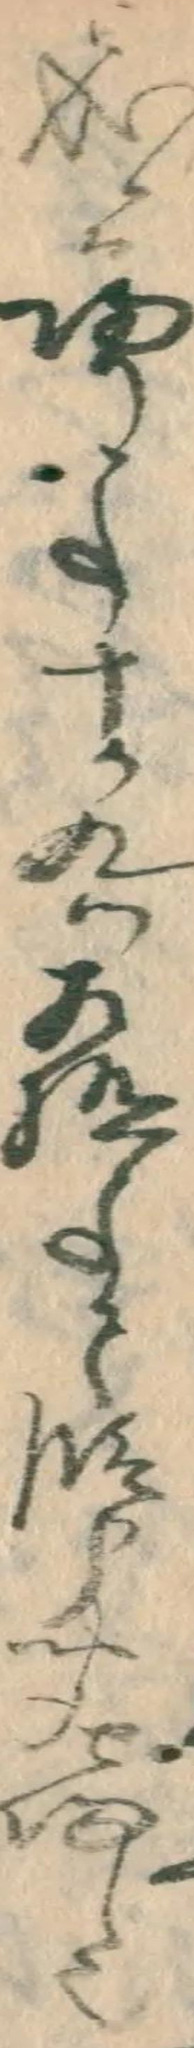被成候而帰り候事十か九ツ相極事ニ候段申聞せ帰し也
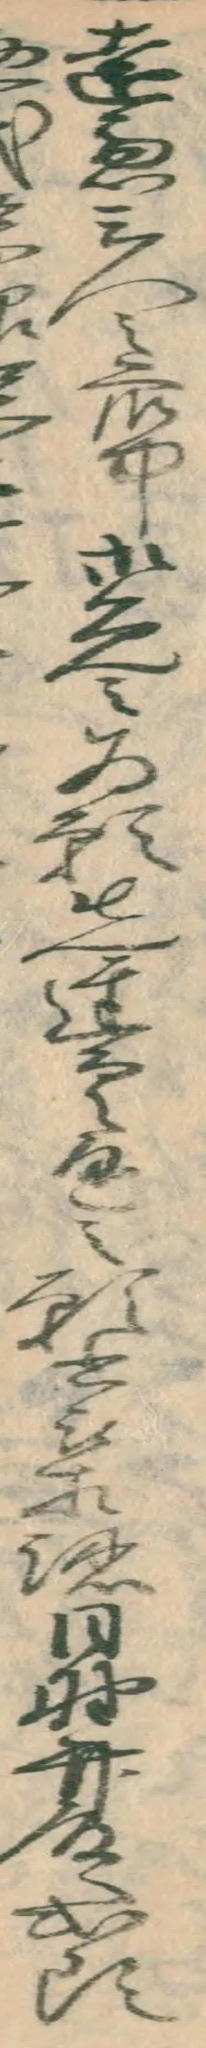一遠慮三人之衆中御免之為願先達而之通之願書被相認日野弁殿へ出頭
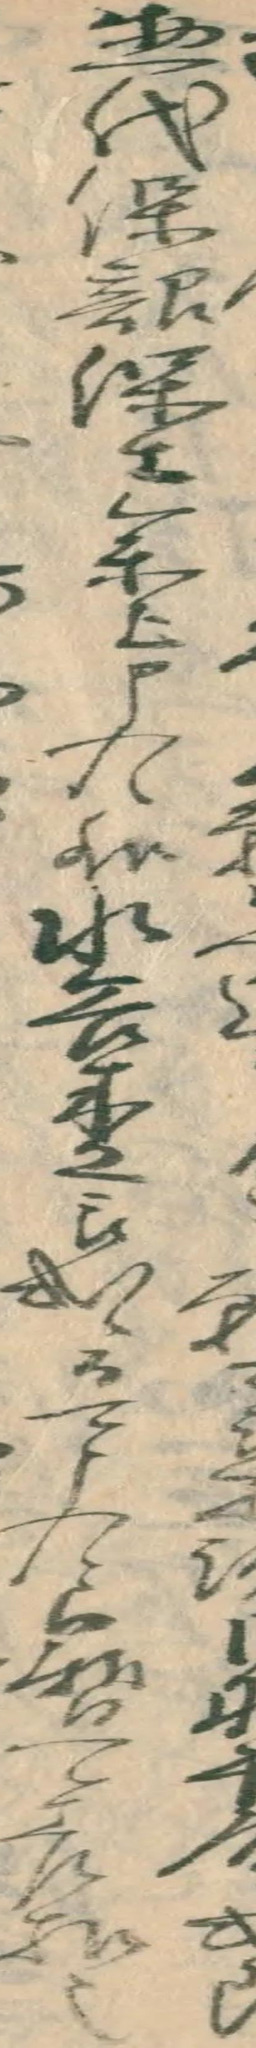惣代保韶保土参上申入候処水谷木工被出候而可申入候間暫可差扣也
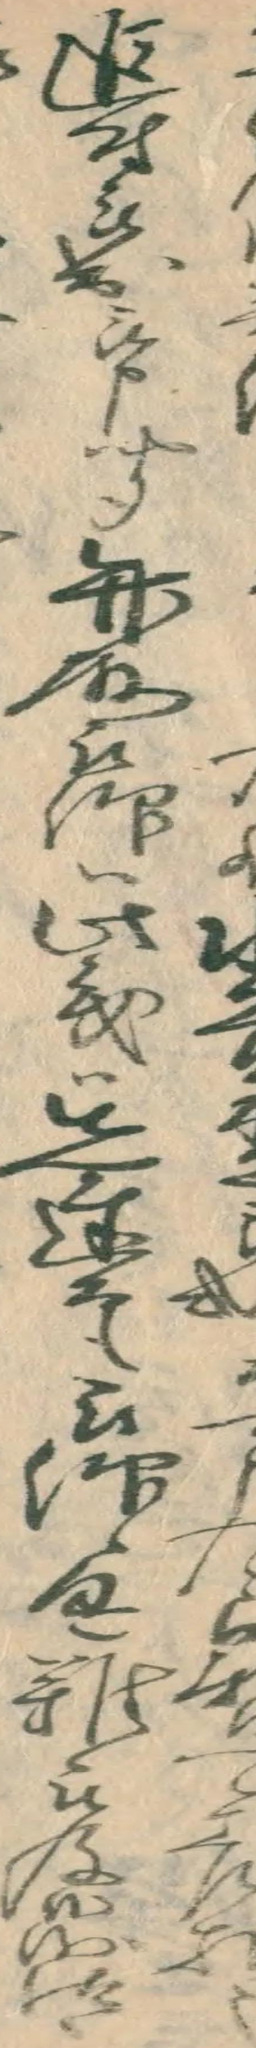追付被出被申聞弁殿被仰ハ此義ハ先達而も被仰候通難被及御沙汰候
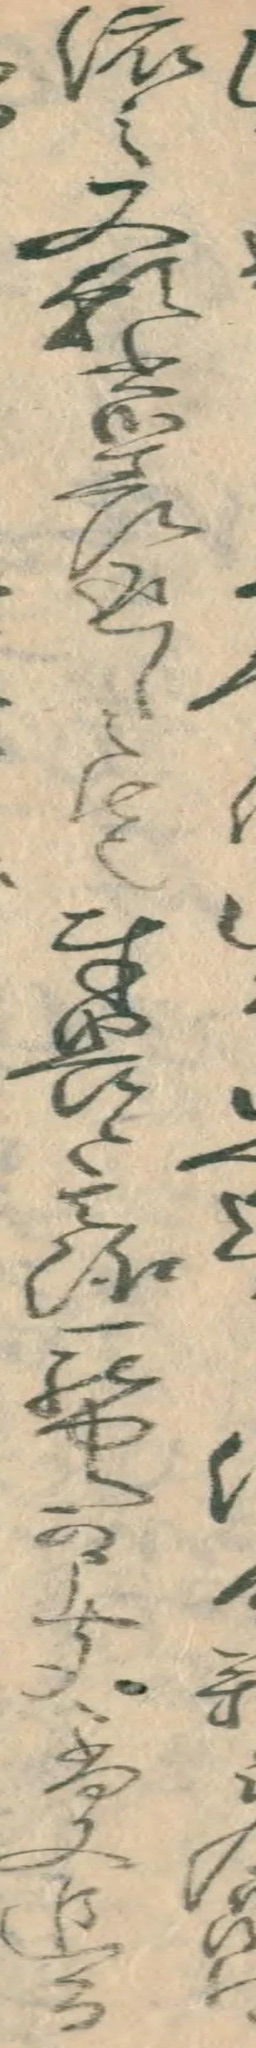依之又願書御差返し之由也奉畏候其趣一社中へ可申聞候尚又追而
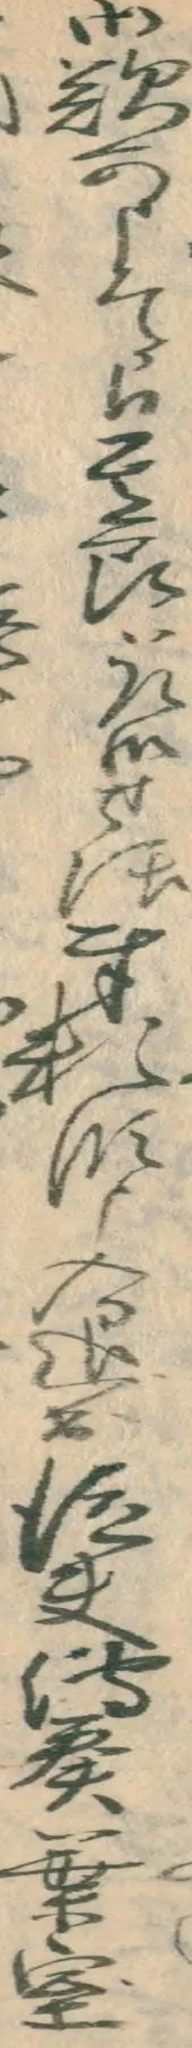御歎可申上候間其節ハ乍御世話奉頼段申入退出従夫伝奏葉室
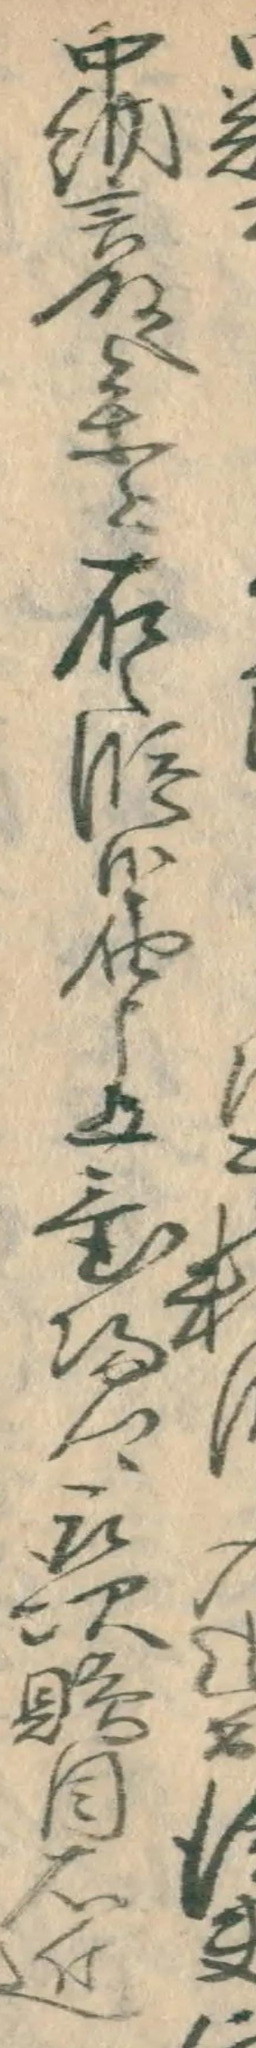中納言殿へ参上右之段御届申上置帰郷取次鵙目右近
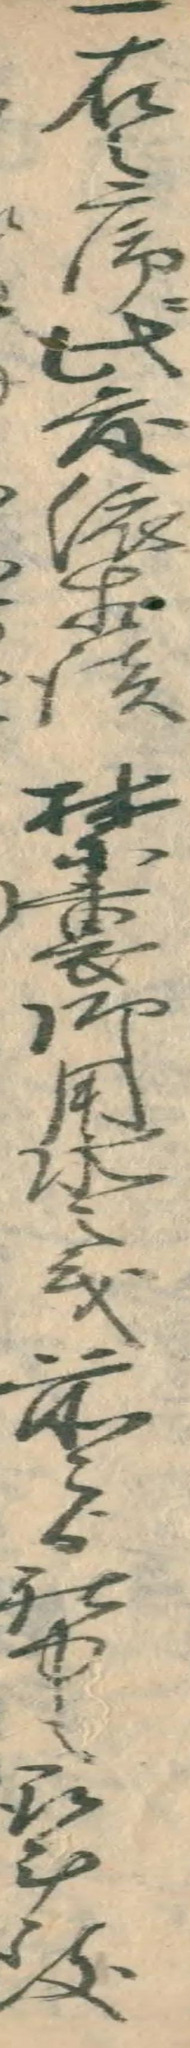一右之序ニ此度依相談禁裏御用水之義前々ゟ社中之取計致
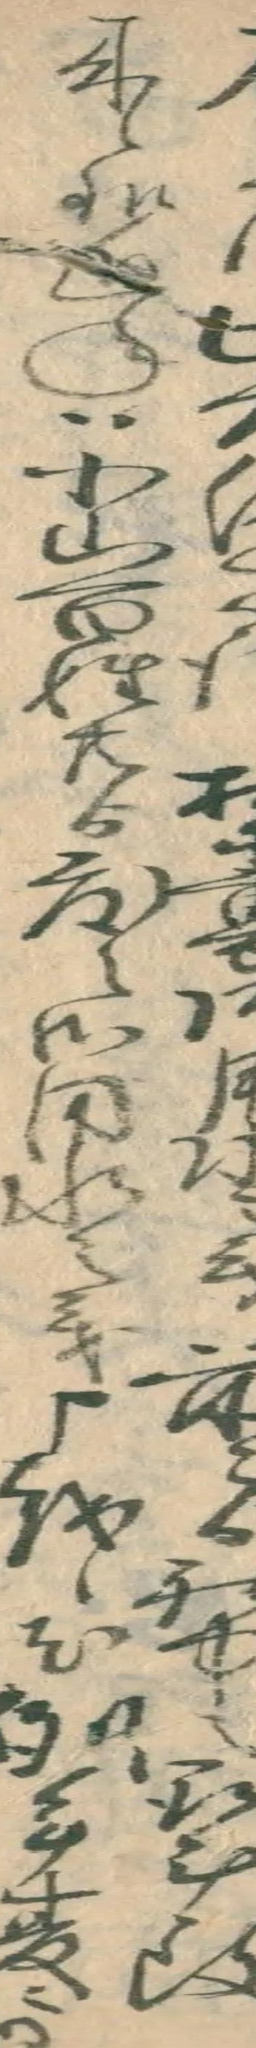来候処近年ハ小山百姓共ゟ度々御用水之義申越候尤例年夏之内
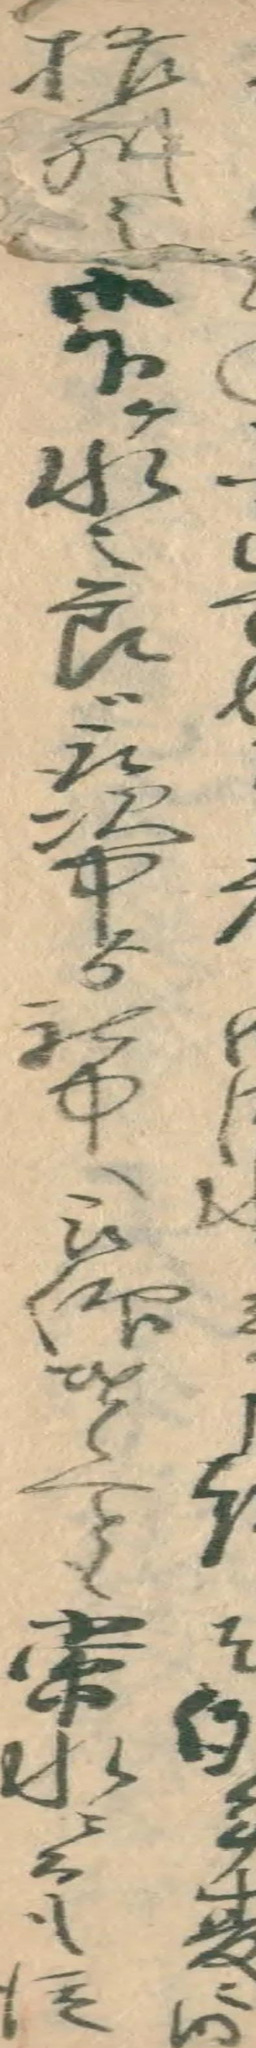格別之御下ケ水之節ハ取次中ゟ社中へ被仰遣候へとも常水ニ而も従

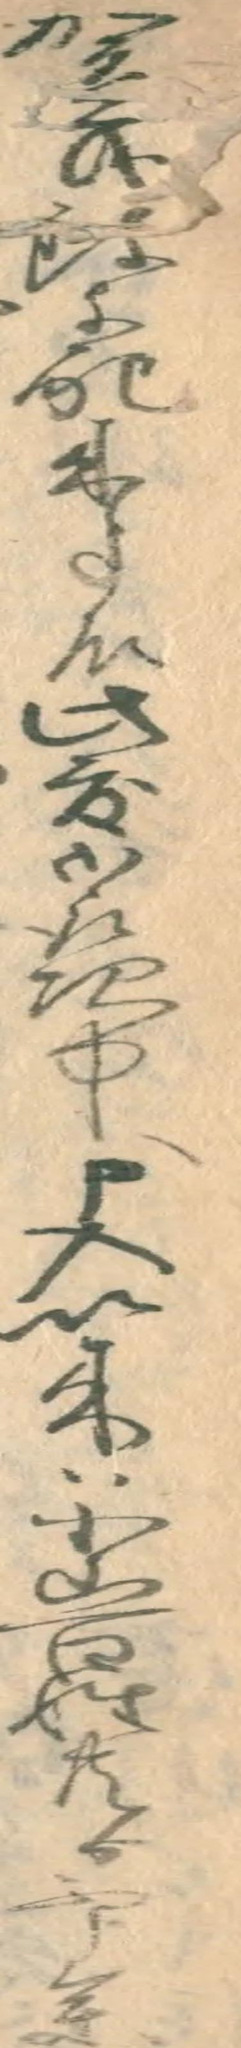賀茂致支配来事故此度御取次中へ申入以来ハ小山百姓共ゟ不申参
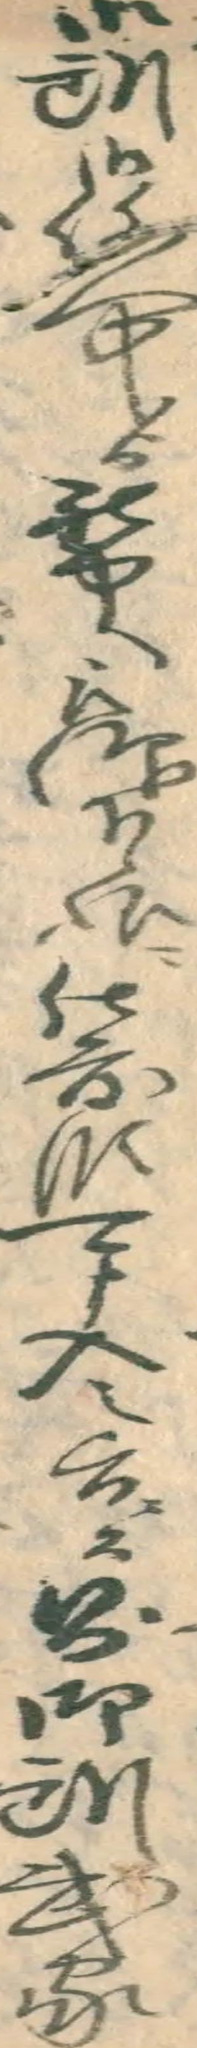御所御役人中ゟ社中へ被仰下候様ニ仕度段可申入之旨ニ而則御所武家
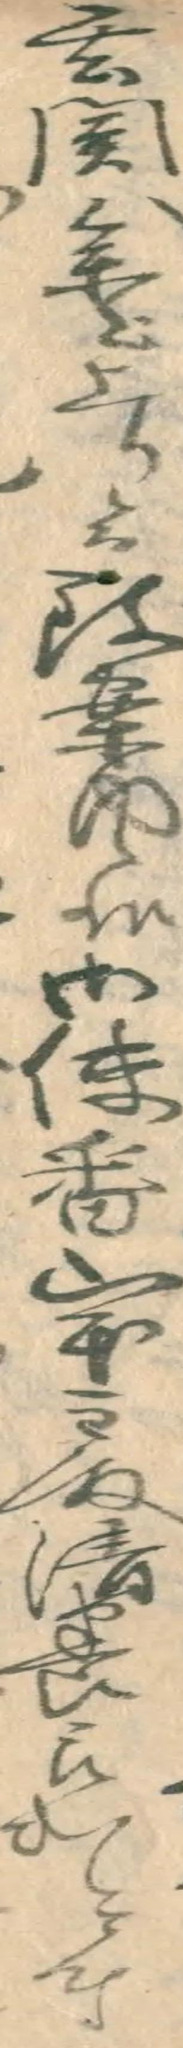玄関へ参上上り候而致案内候処御使番山本主殿清養被出候ニ付
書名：賀茂社記録. 第58冊
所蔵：国立国会図書館 National Diet Library, JAPAN
